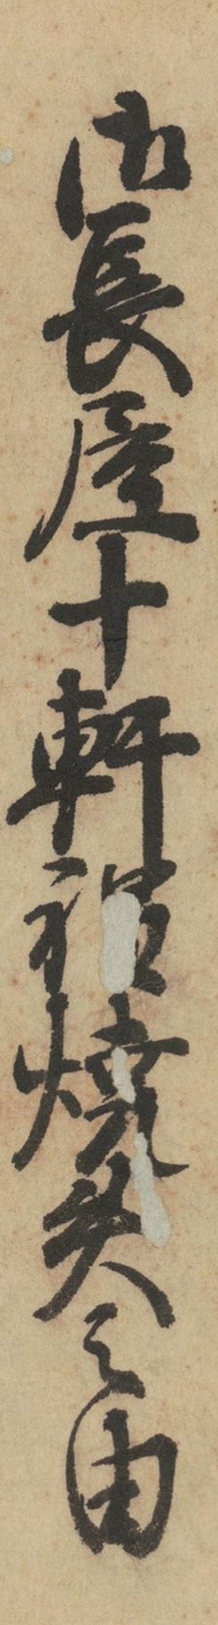御長屋十軒程焼失之由
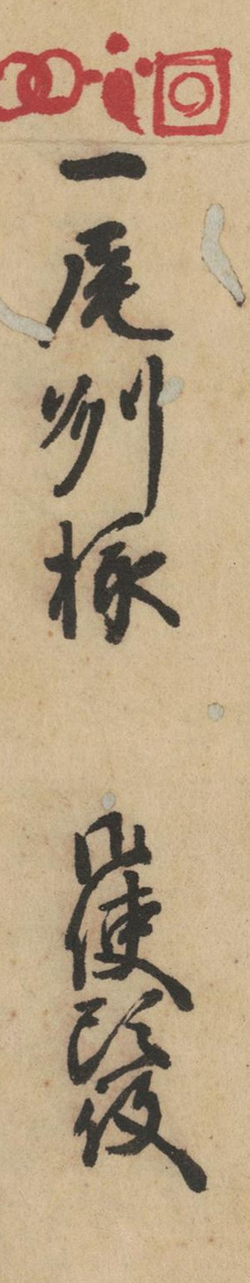一尾州様御使頭役
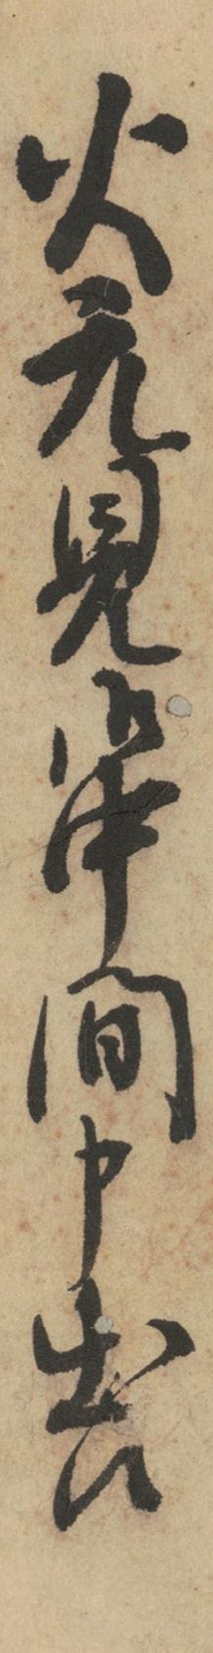火元見御中間申出候
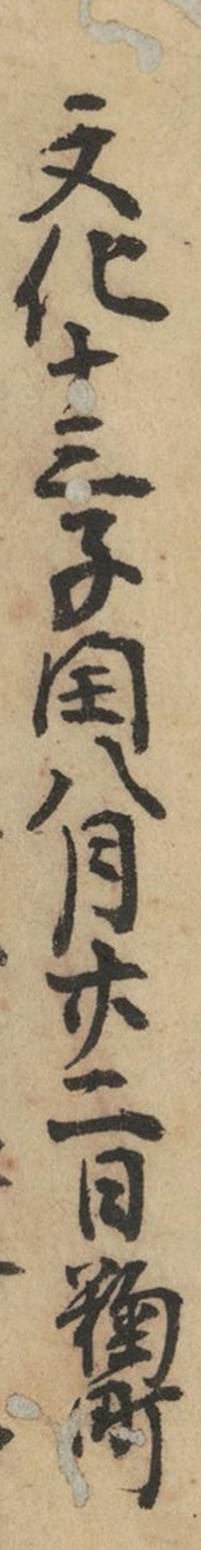文化十三子閏八月廿二日麹町
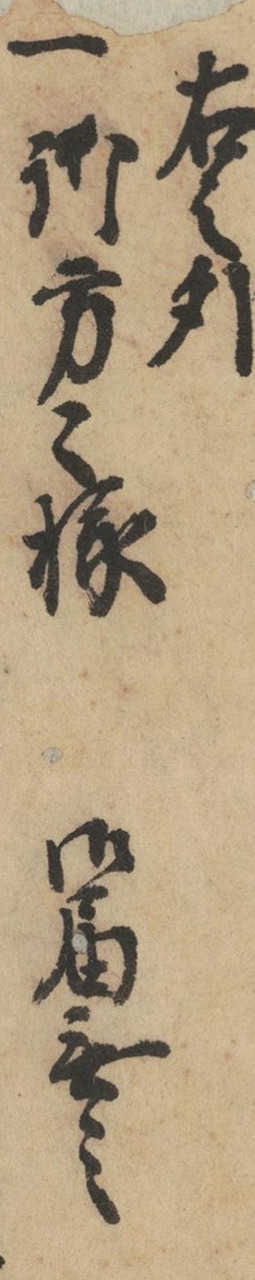一御方々様御届無之
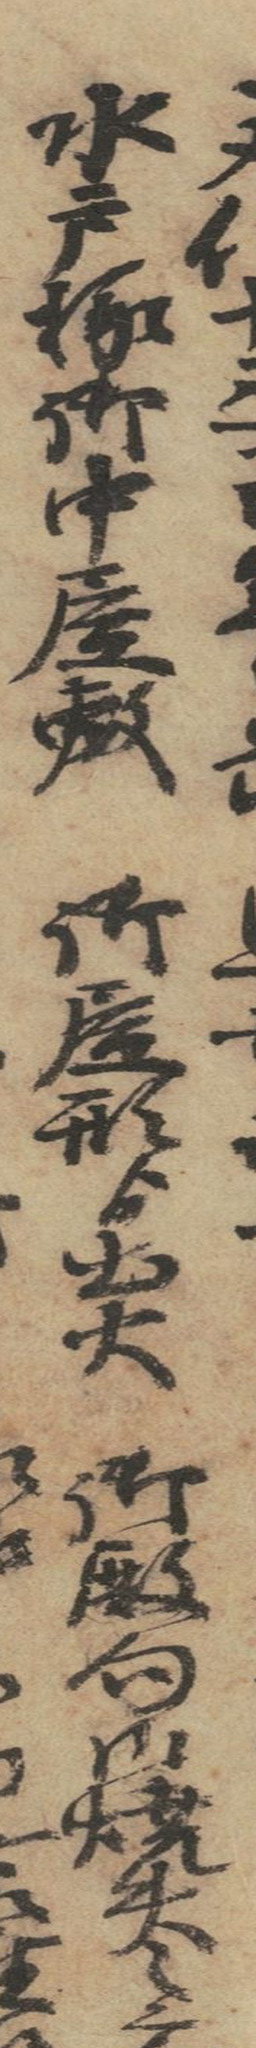水戸様御中屋敷御屋形ゟ出火御殿向御焼失之節
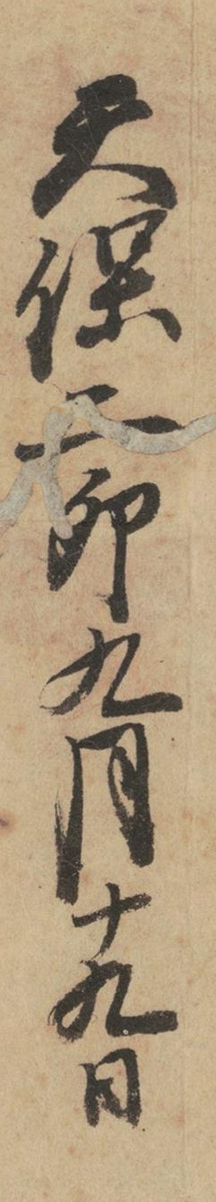天保二卯九月十九日
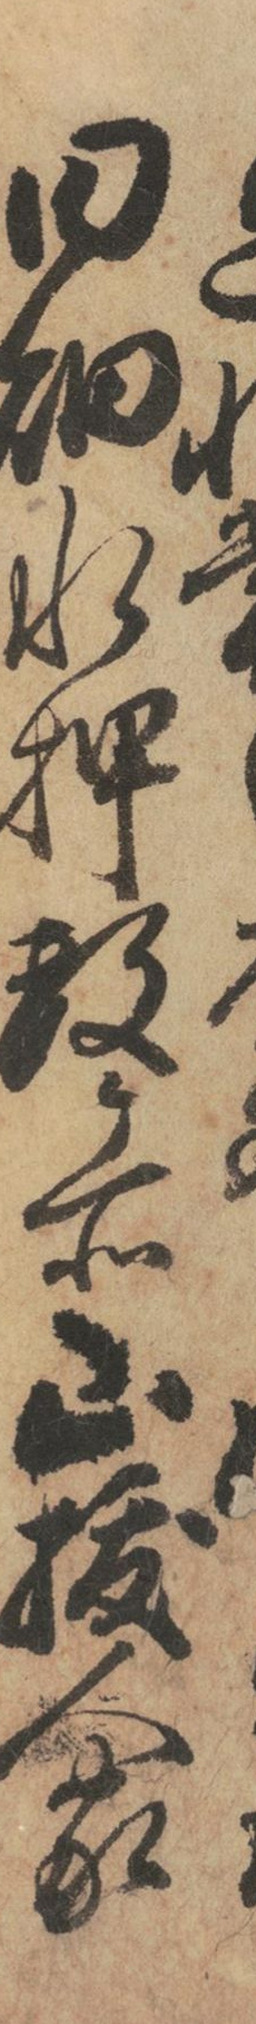田畑水押数ヶ所山抜人家
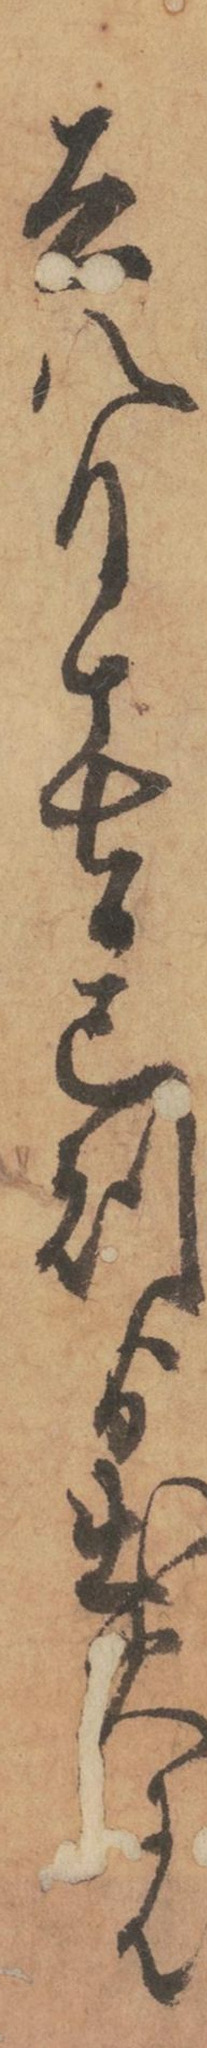右同断去八月十七日巳刻ゟ出火にて
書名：[紀州藩災害記録]
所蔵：東京大学地震研究所図書室 Earthquake Research Institute Library, The University of Tokyo, JAPAN
